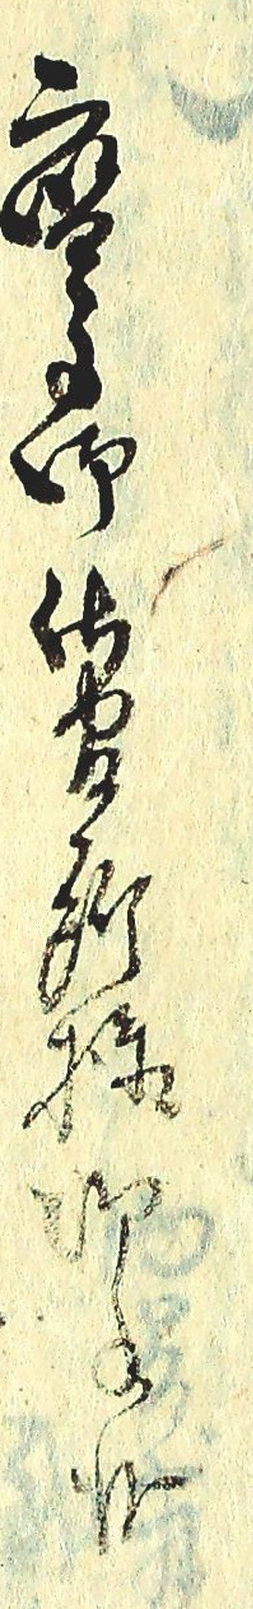藍方御代官所様御手代
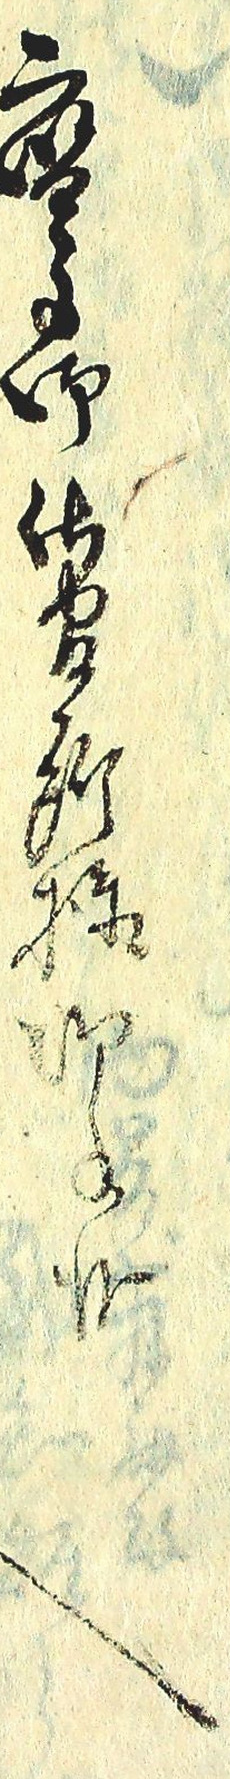藍方御代官所様御手代
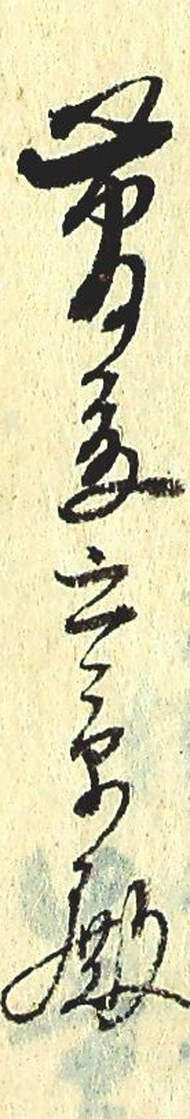菅藤六兵衛殿
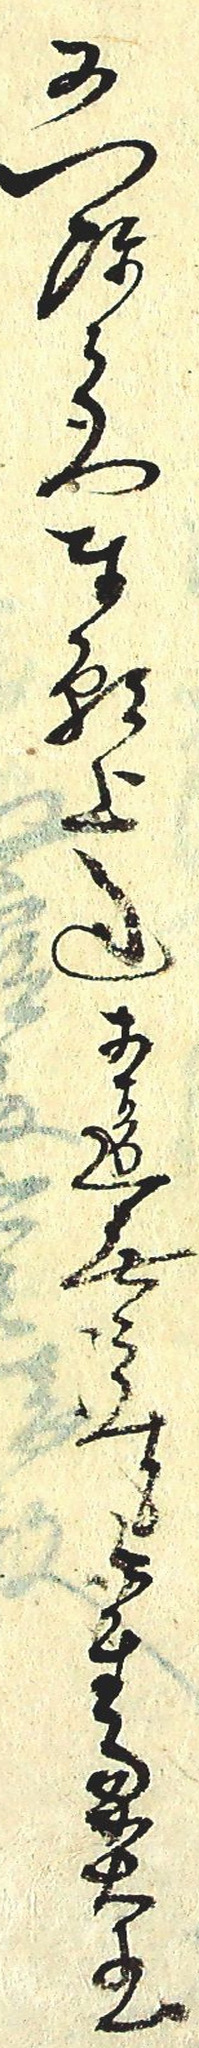右弥右衛門奉願上通相違無御座候に付奥書
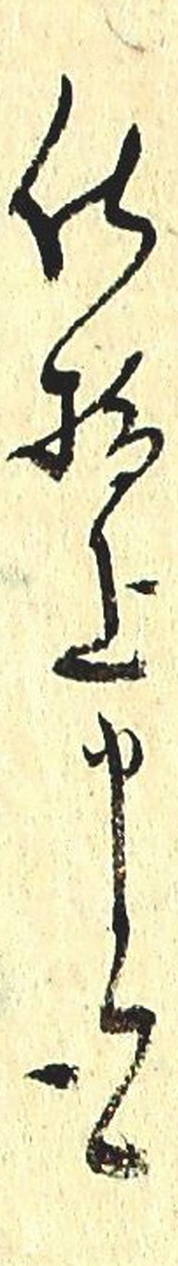仕指上申候以上
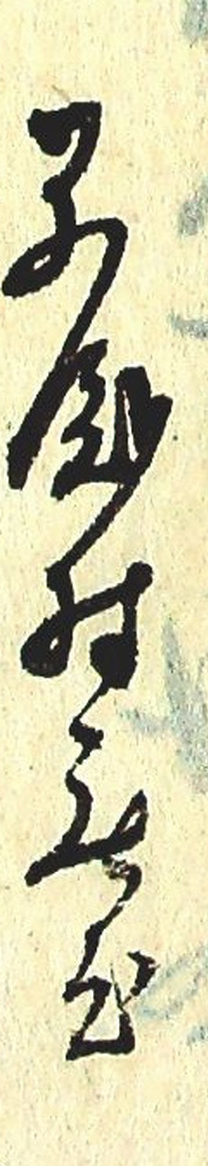早淵村庄屋
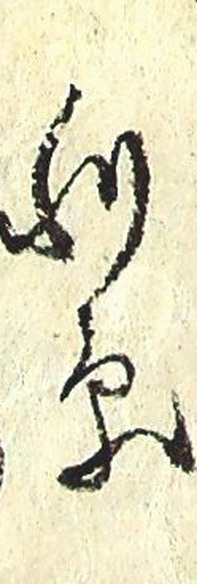利兵衛
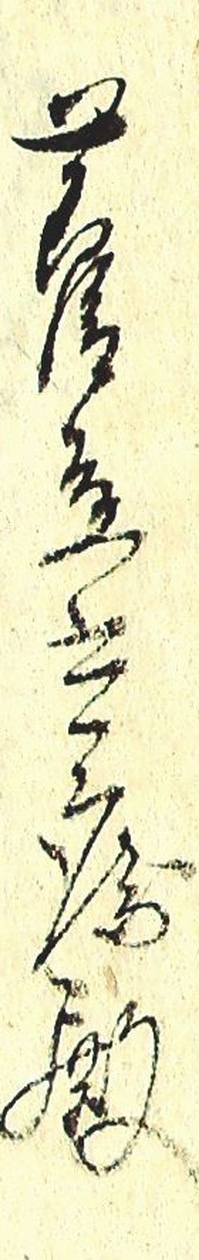菅藤六兵衛殿

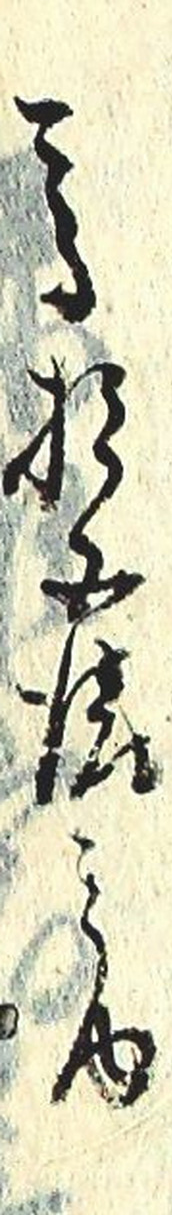高拾五俵之内
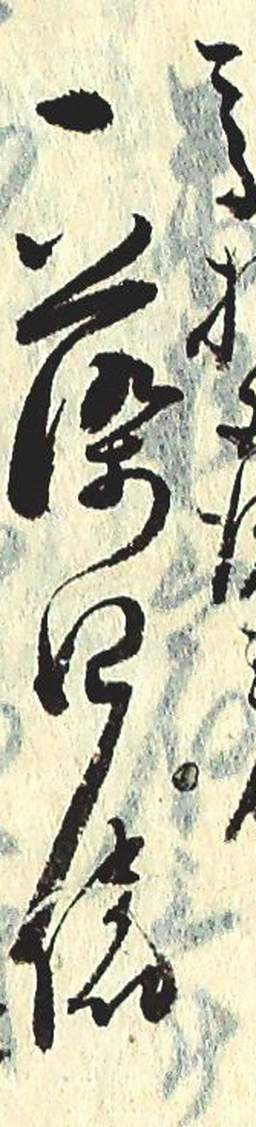一蒅四俵
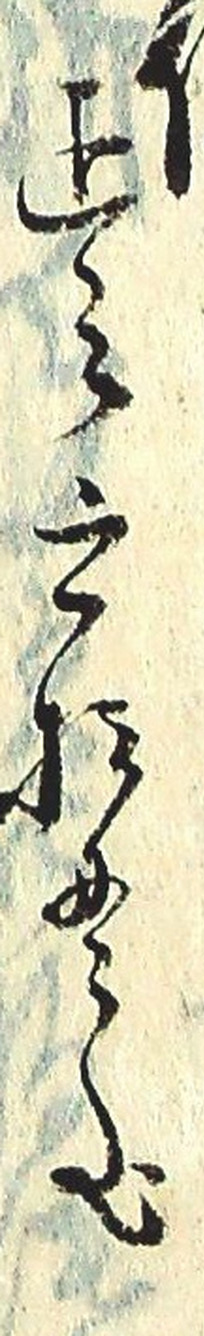正み六拾貫匁
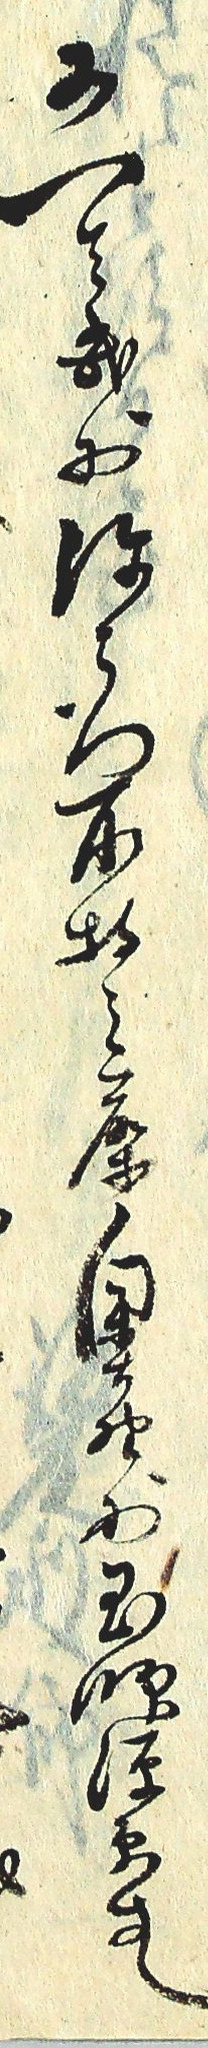右は当村弥右衛門所持之蒅奥野村玉師源兵衛方へ
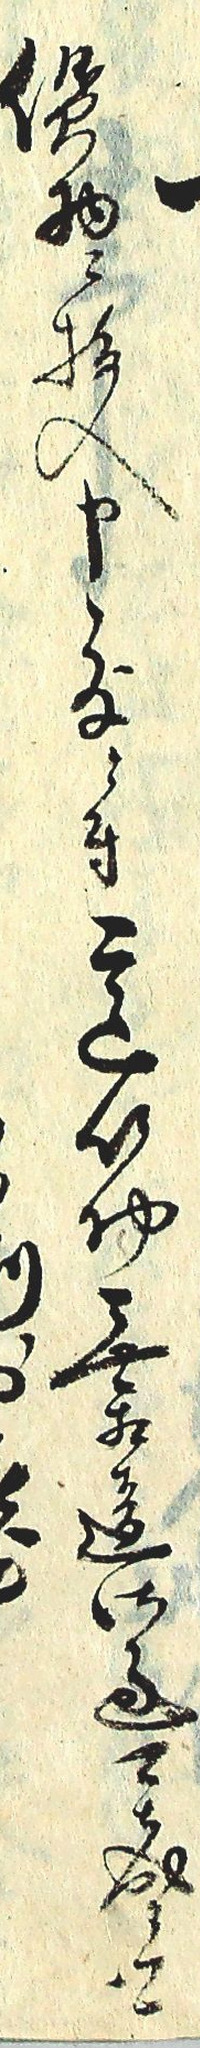質物に指入申度に付道筋無相違御通可被成候以上
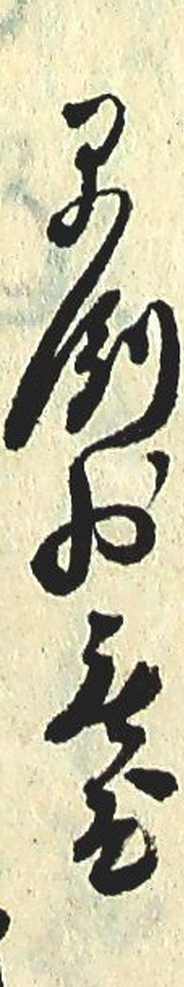早淵村庄屋
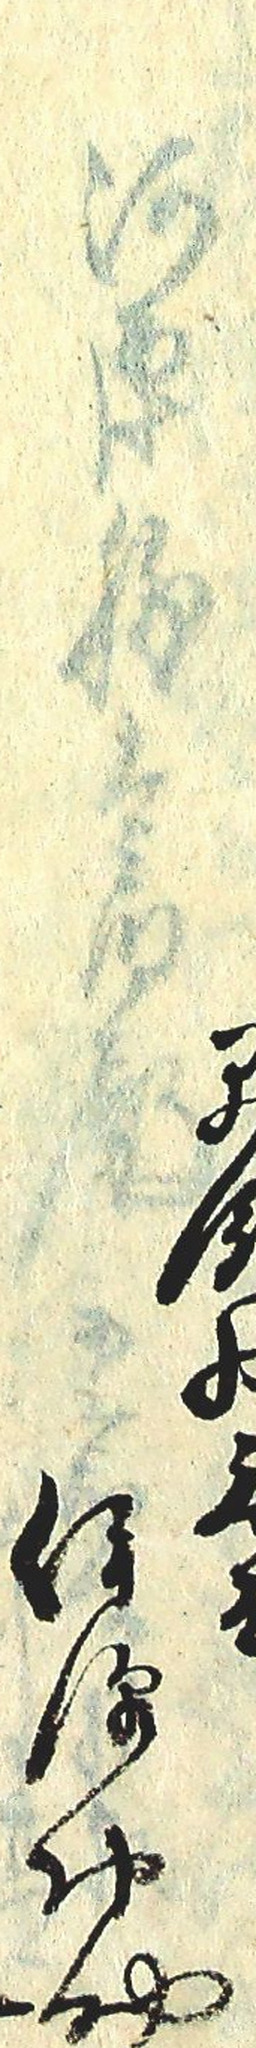伊沢仲助
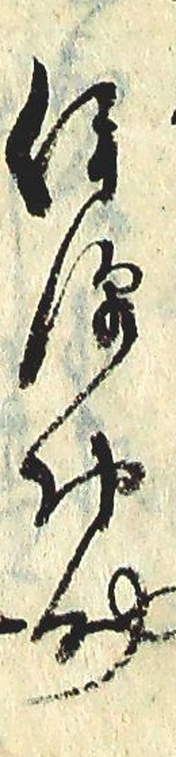伊沢仲助
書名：諸御願書控(弐番）
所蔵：鳴門教育大学 Naruto University of Education
